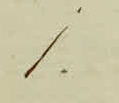1.
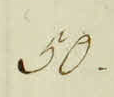50
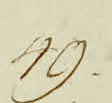49
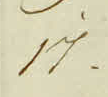17
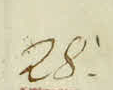28
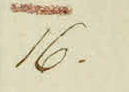13.
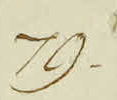79
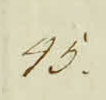45
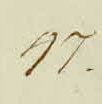47
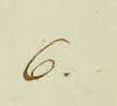6.
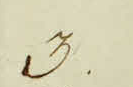3.
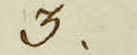3.
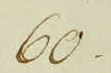60
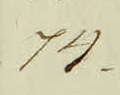74
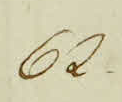62
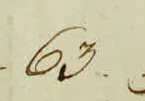63.
